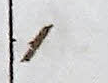1
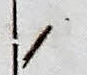1
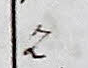2
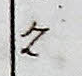2
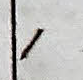1
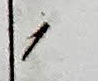1
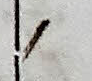1
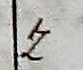2
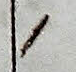1
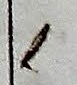1
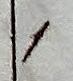1
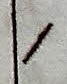1
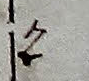2
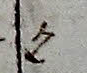2
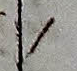1
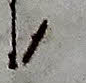1
